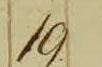19.
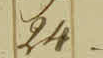24
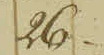26
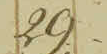29.
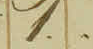1.
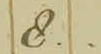8.
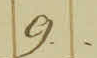9.
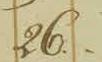26.
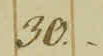30.
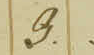3.
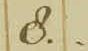8.
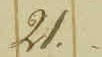21.
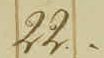22.
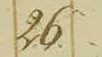26.
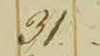31.
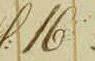16
